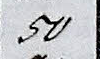50
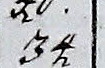34
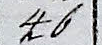46
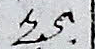25
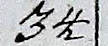34
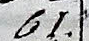61
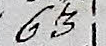63
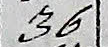36
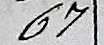67
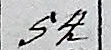54
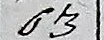63
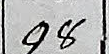98
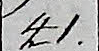41
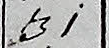31
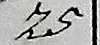25
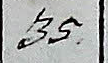35.
